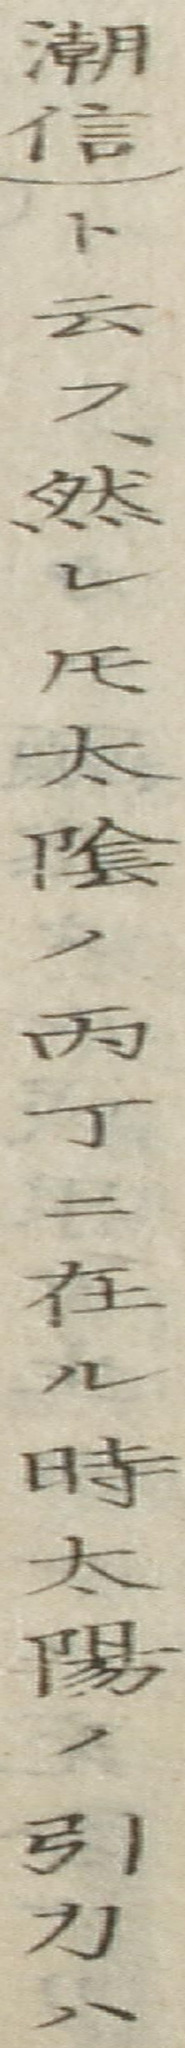潮信）ト云フ、然レトモ太陰ノ丙丁ニ在ル時大陽ノ引力ハ
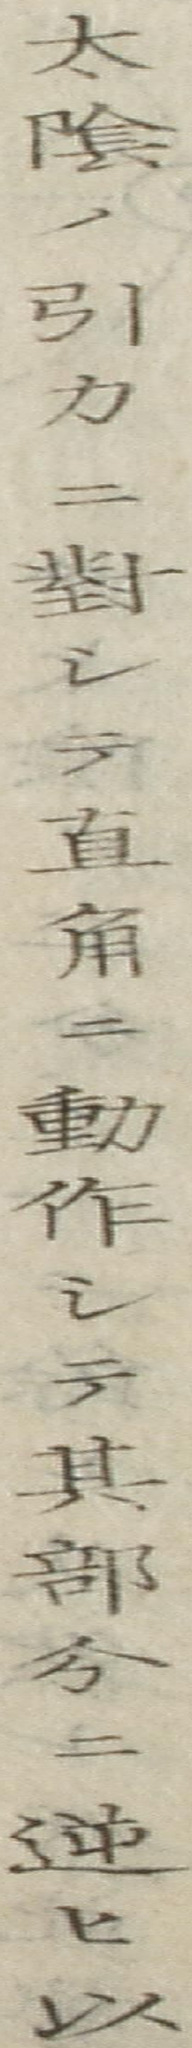太陰ノ引力ニ対して直角ニ動作シテ其部分ニ逆ヒ以
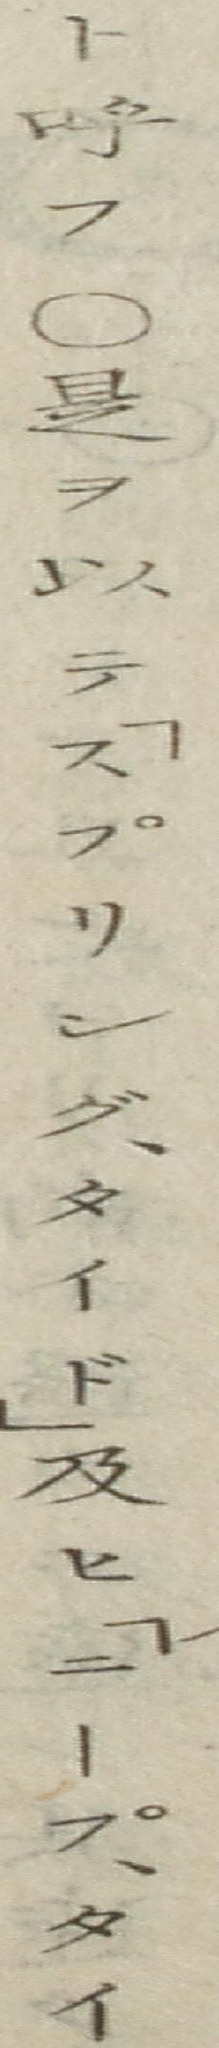ト呼フ○是ヲ以テ「スプリング、タイド」及ヒ「ニープ、タイ
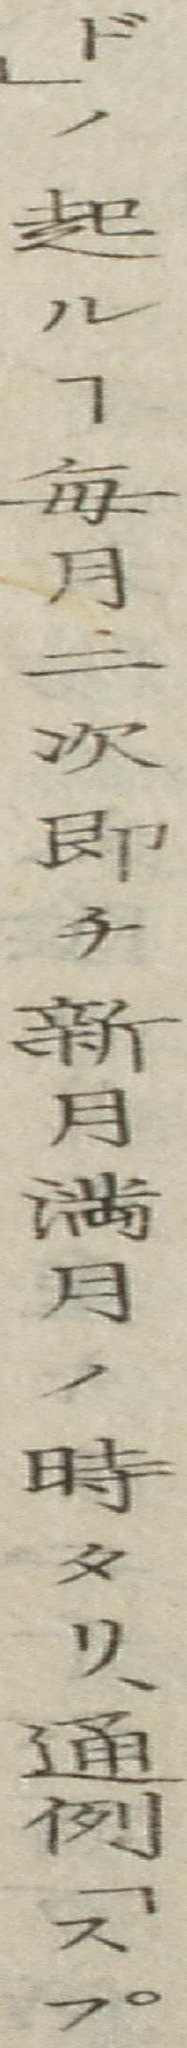ド」ノ起ルヿ毎月二次即チ新月満月ノ時タリ、通例「スプ
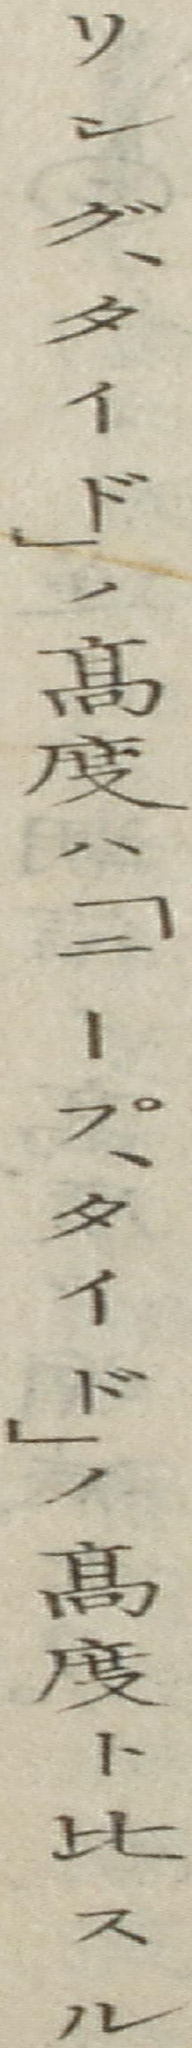リング、タイド」ノ高度ハ「ニープ、タイド」ノ高度ト比スル
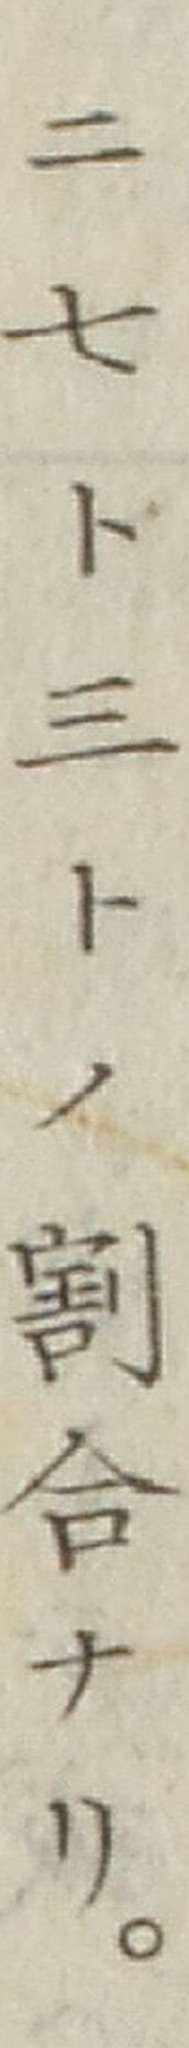ニ七ト三トノ割合ナリ。
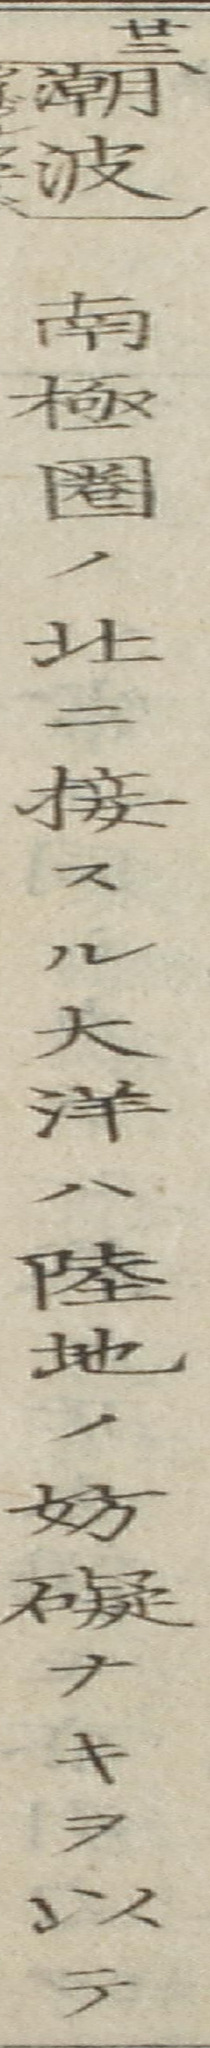廿二〔潮波〕南極圏ノ北ニ接スル大洋ハ陸地ノ妨礙ナキヲ以テ
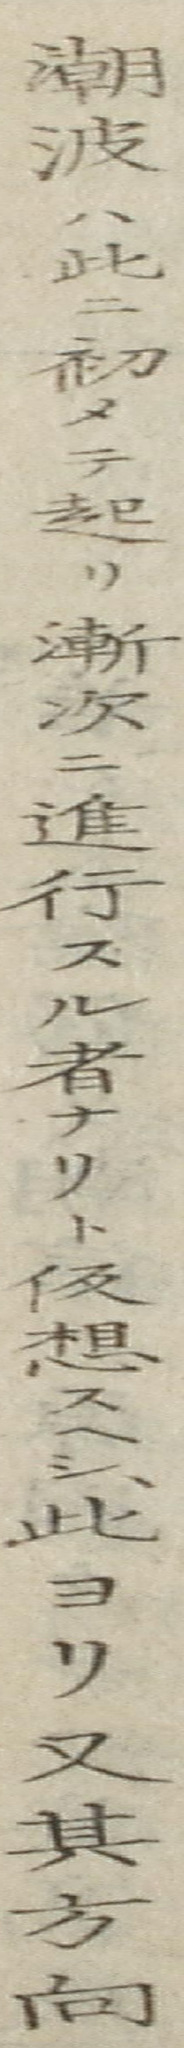潮波ハ此ニ初メテ起リ漸次ニ進行スル者ナリト仮想スヘシ、此ヨリ又其方向
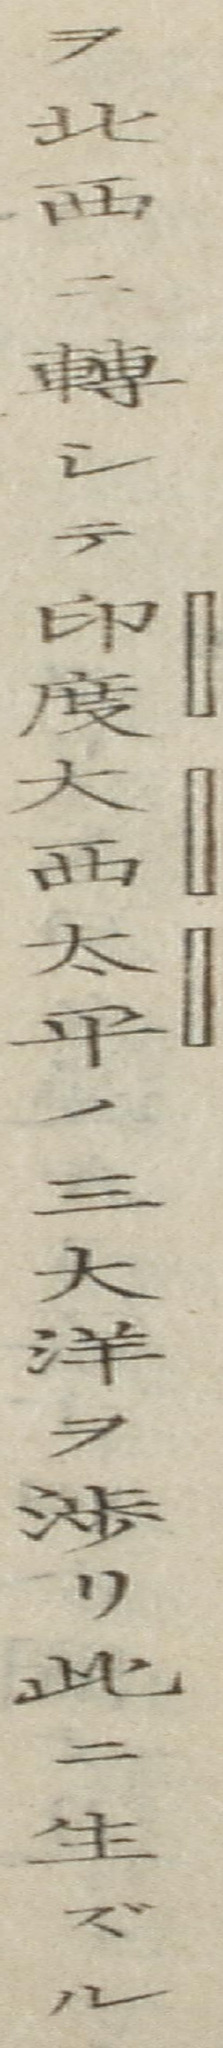ヲ北西ニ転シテ印度大西太平ノ三大洋ヲ渉リ此ニ生ズル
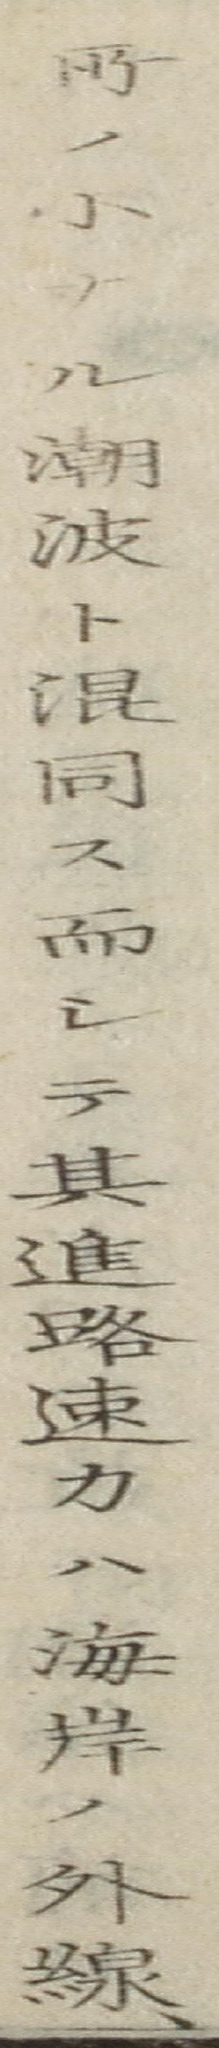所ノ小ナル潮波ト混同ス而シテ其進路速力ハ海岸ノ外線、
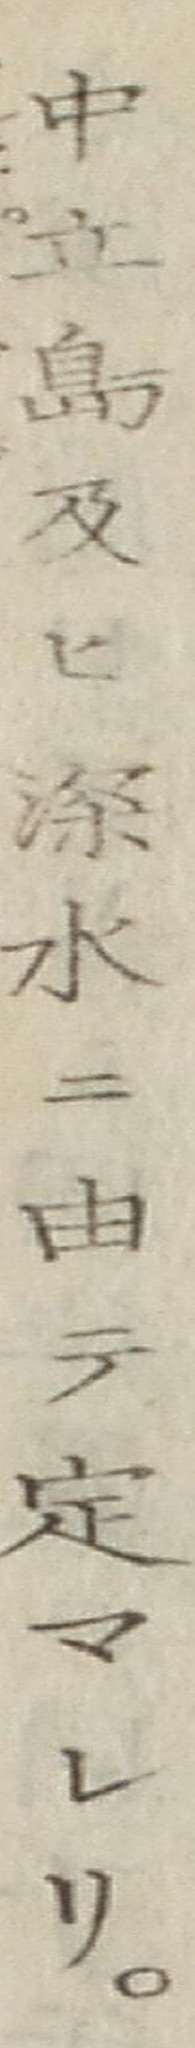中立島及ヒ深水ニ由テ定マレリ。
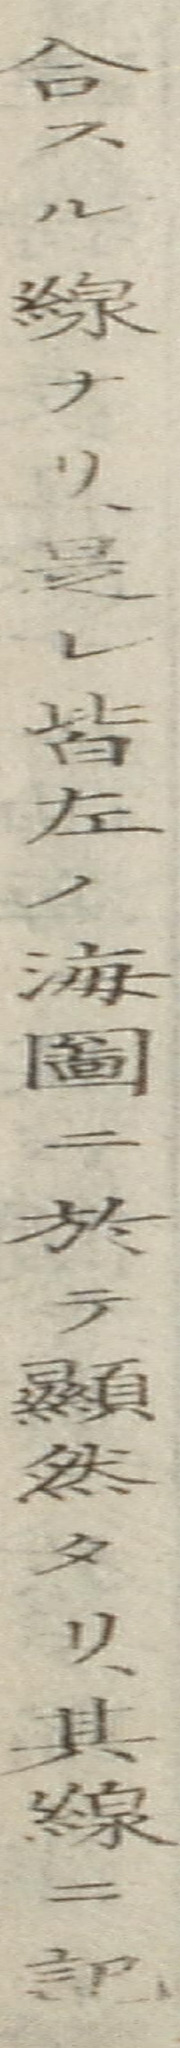合スル線ナリ、是レ皆左ノ海図ニ於テ顕然タリ、其線ニ記ル
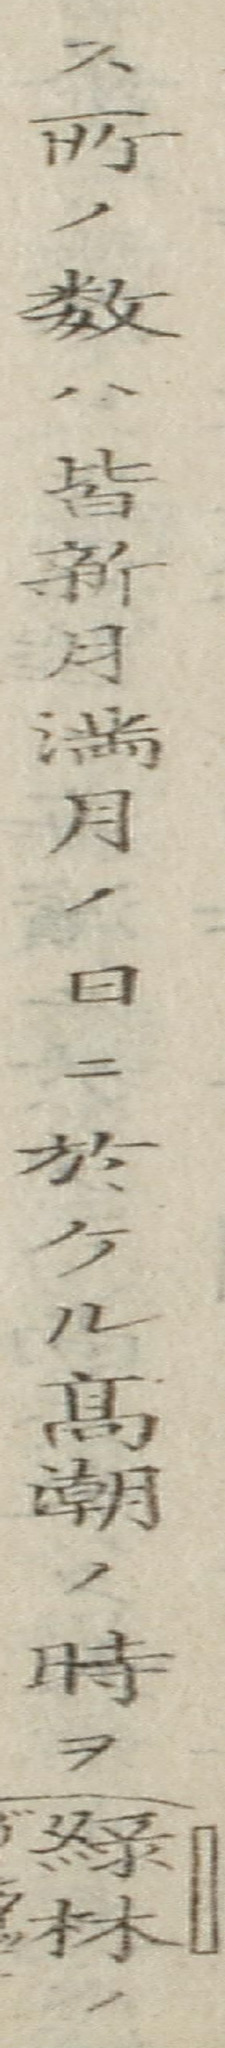ス所ノ数ハ皆新月満月ノ日ニ於ケル高潮ノ時ヲノ時
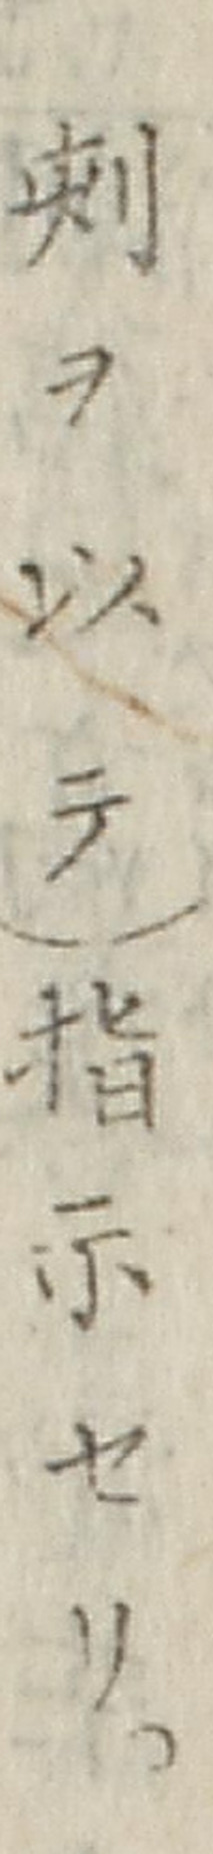刻ヲ以テ）指示セリ。

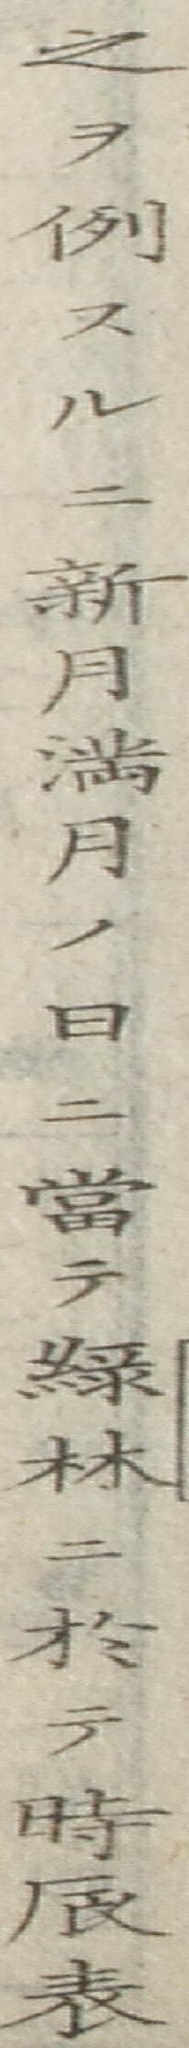之ヲ例スルニ新月満月ノ日ニ当テ緑林ニ於テ時辰表
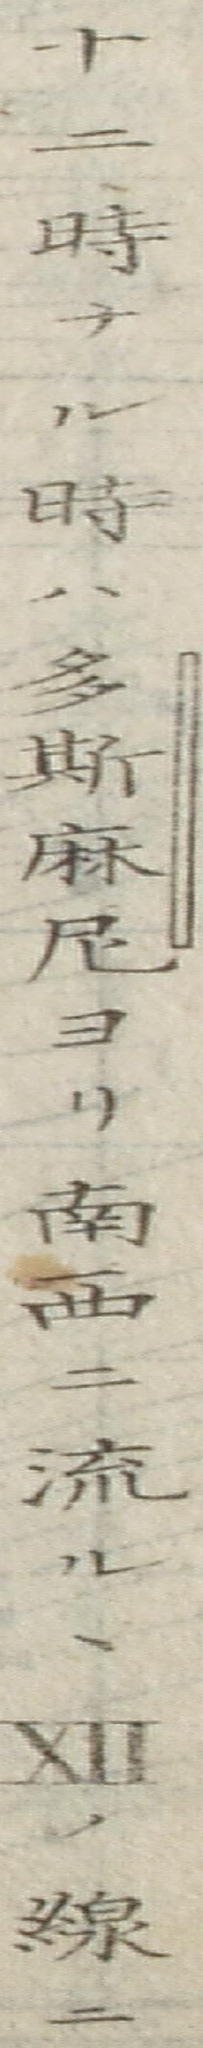十二時ナル時ハ多斯麻尼ヨリ南西ニ流ルヽⅫノ線ニ
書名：地形論　巻二
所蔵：東京大学地震研究所図書室 Earthquake Research Institute Library, The University of Tokyo, JAPAN
